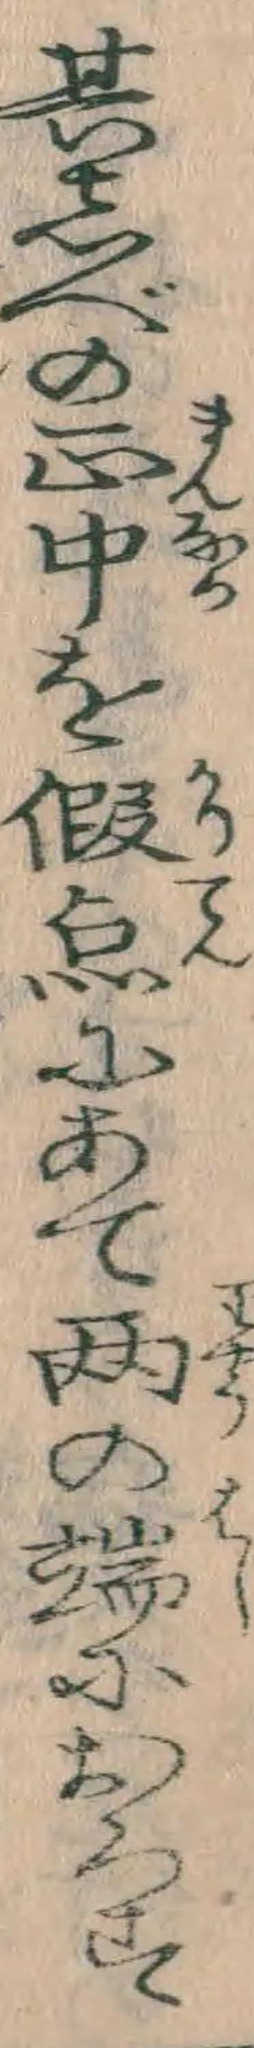其しべの正中を仮点にあて両の端におろす
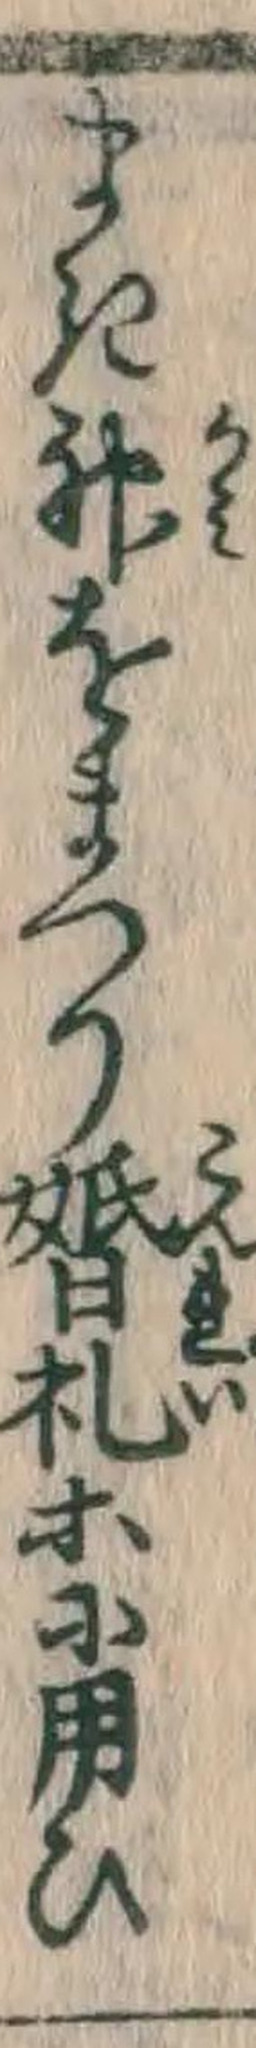まき神をまつり婚礼等に用ひ
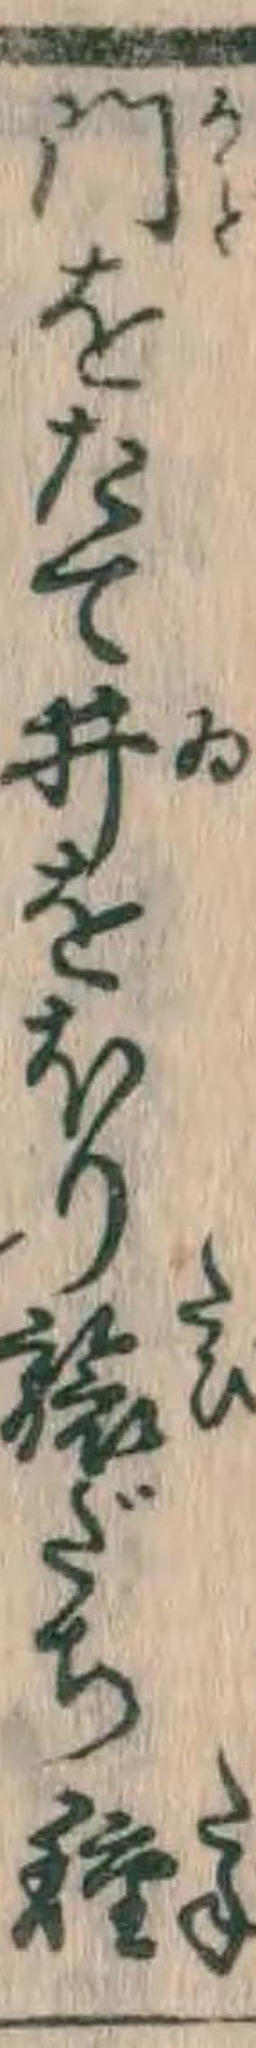門をたて井をほり旅だち種
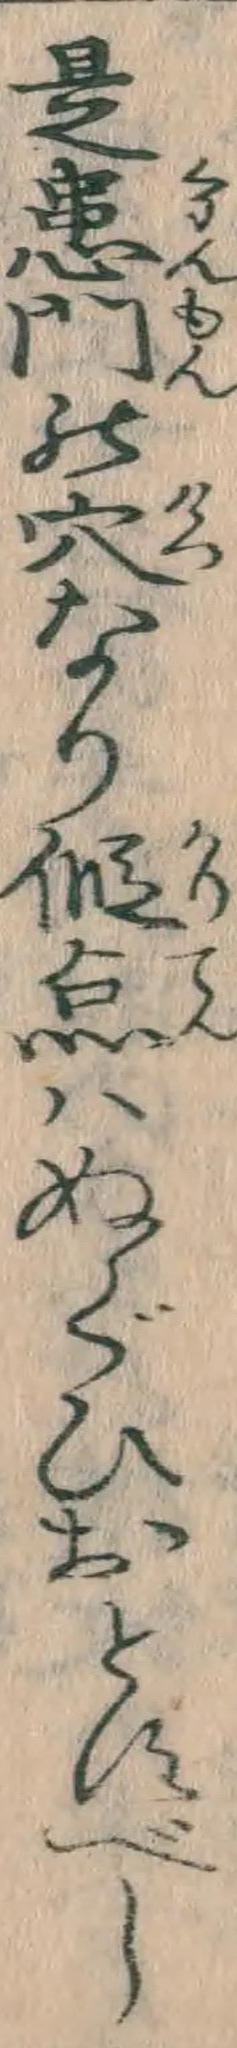是患門の穴なり仮点はぬぐひおとすべし
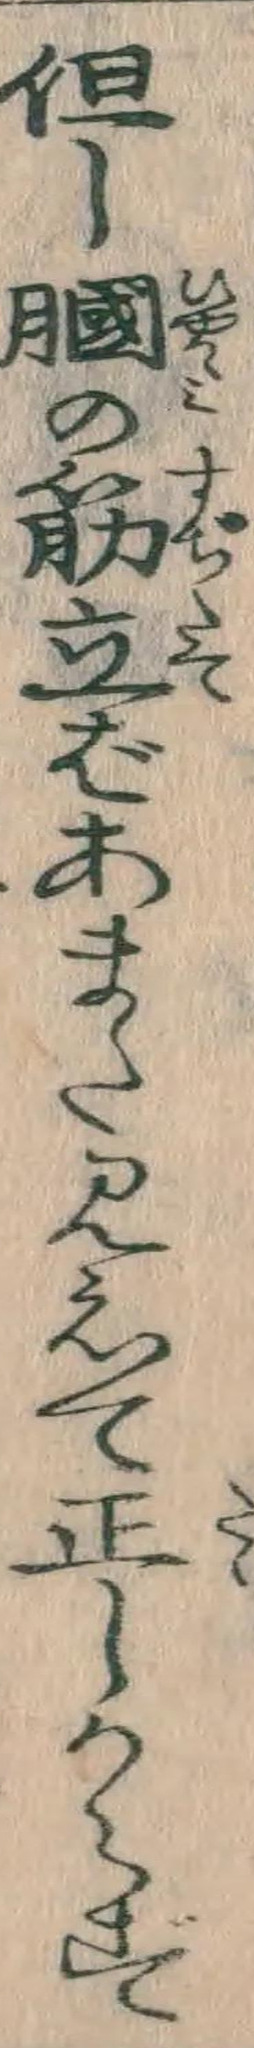但し膕の筋立ばあまた見えて正しからず
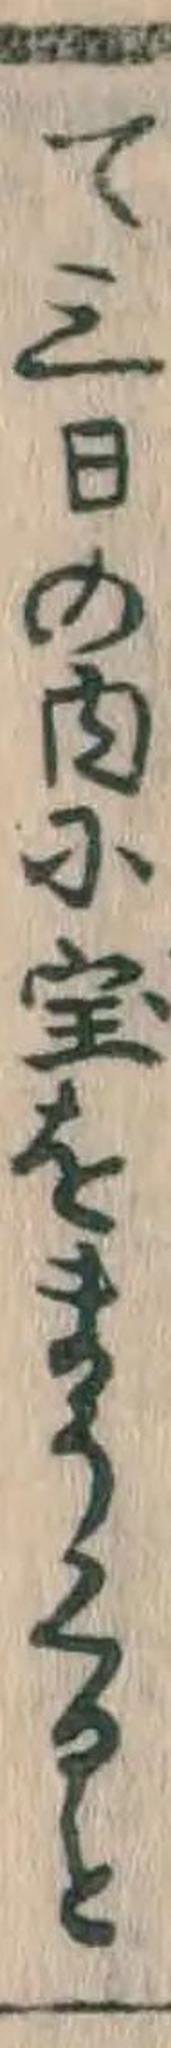て三日の内に宝をまうくると
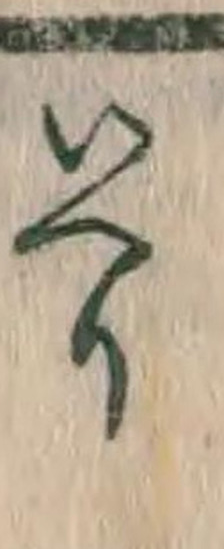いへり
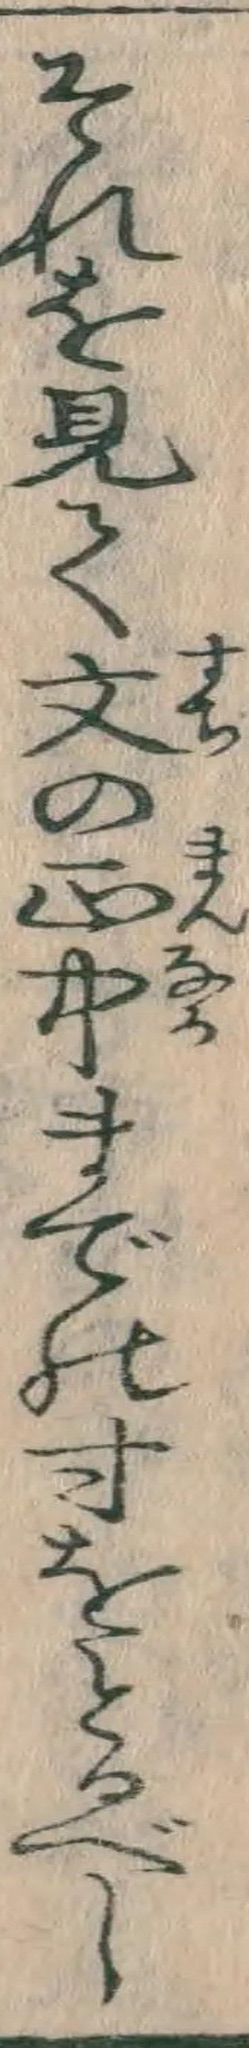それを見て文の正中までの寸をとるべし
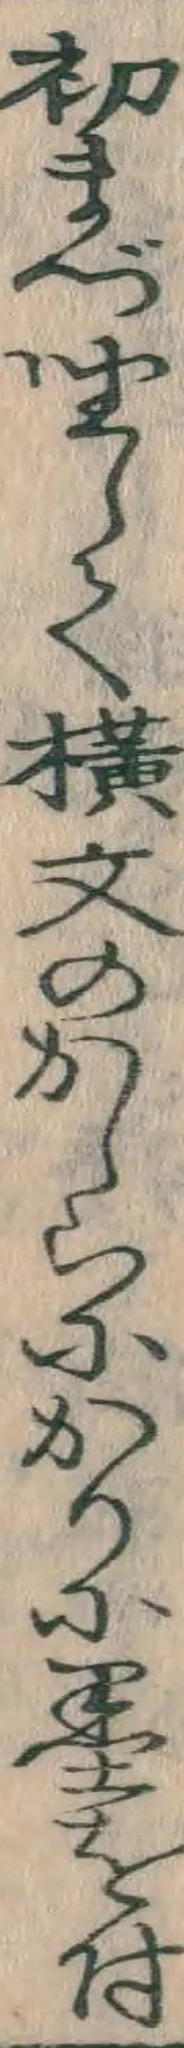初まづ坐して横文のかしらにかりに墨を付
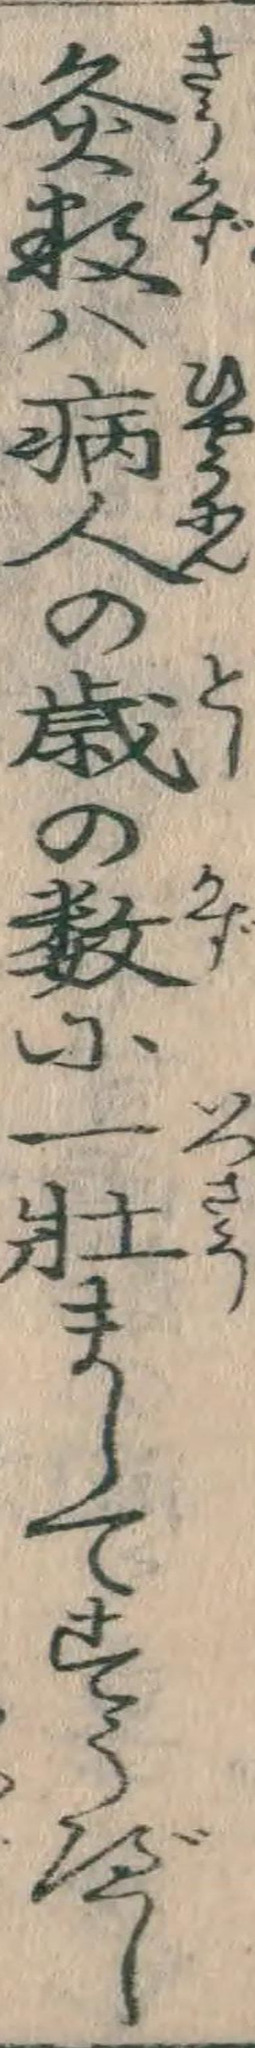灸数は病人の歳の数に一壮ましてすうべし
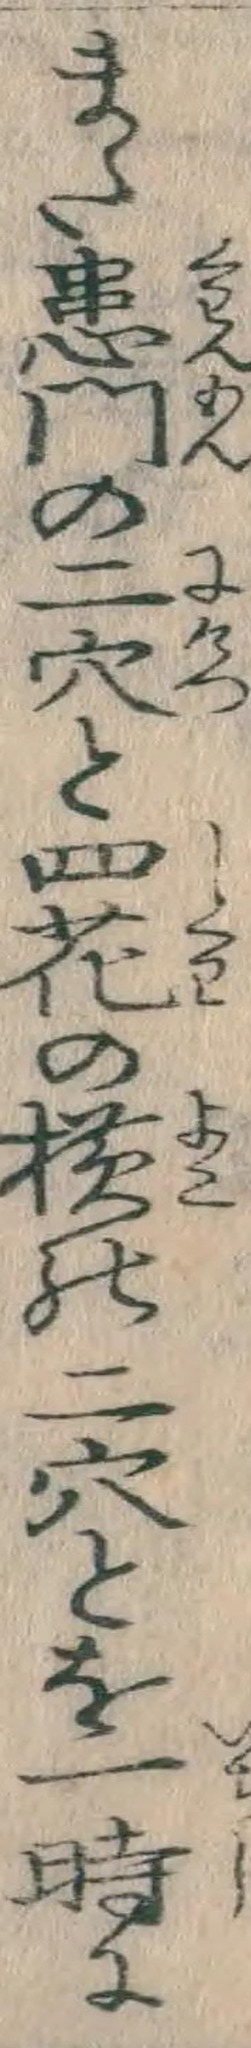また患門の二穴と四花の横の二穴とを一時に
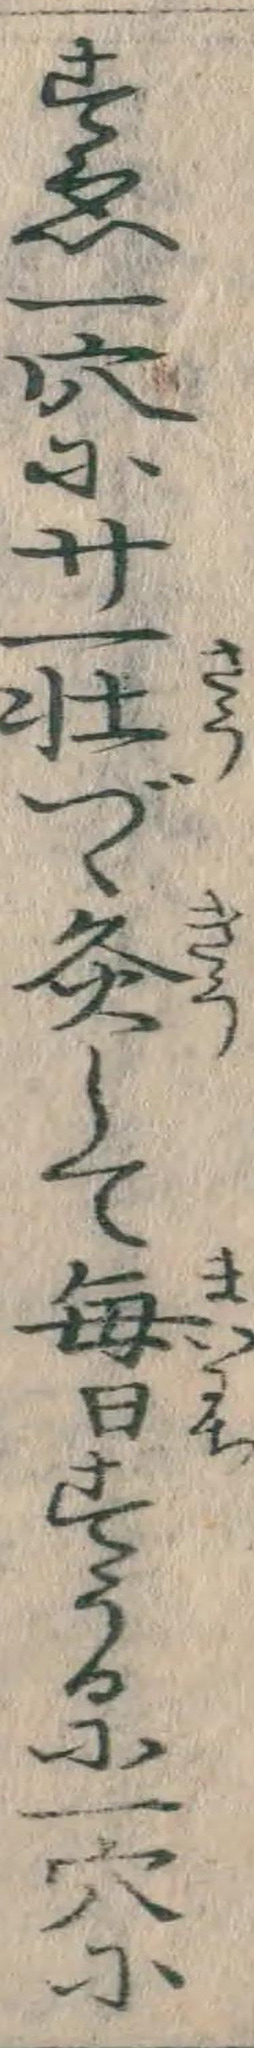すゑ一穴に廿一壮づゝ灸して毎日すうるに一穴に
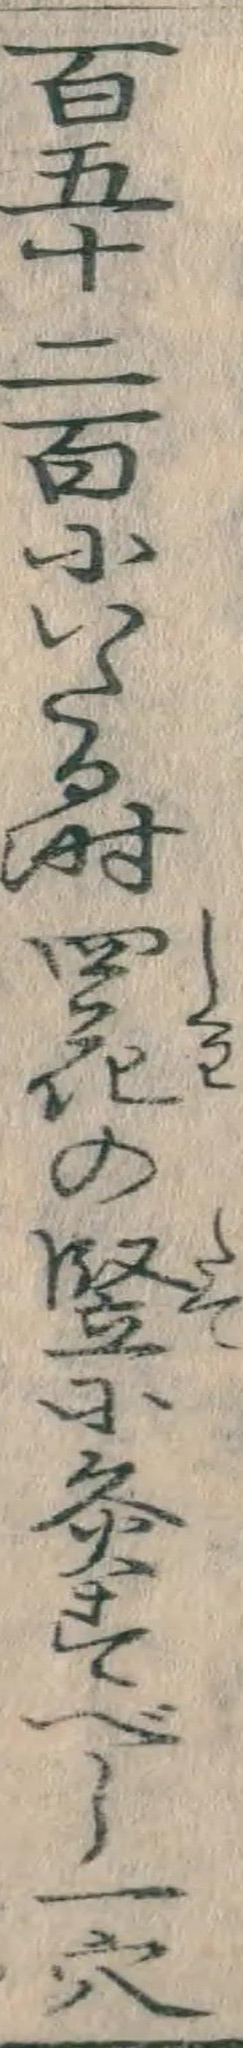百五十二百にいたる時四花の竪に灸すべし一穴
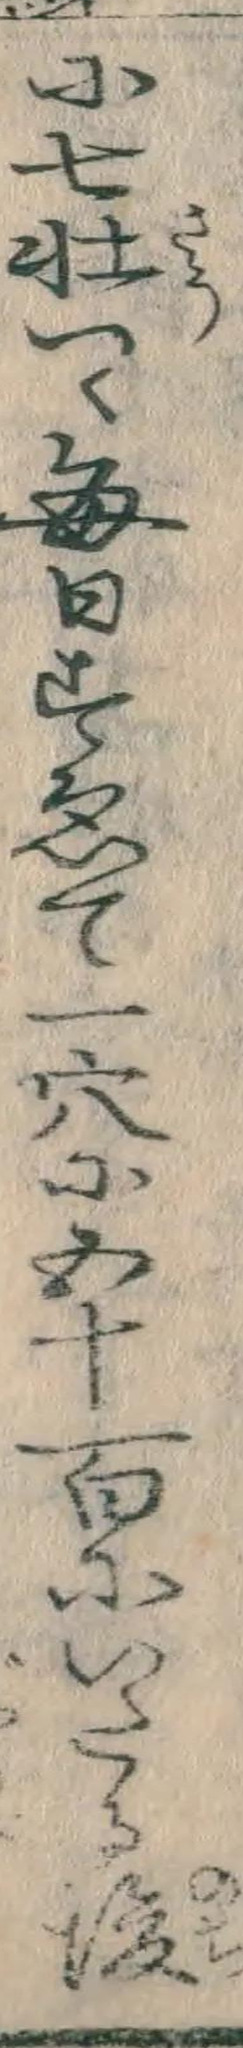に七壮つゝ毎日すゑて一穴に五十百にいたる後
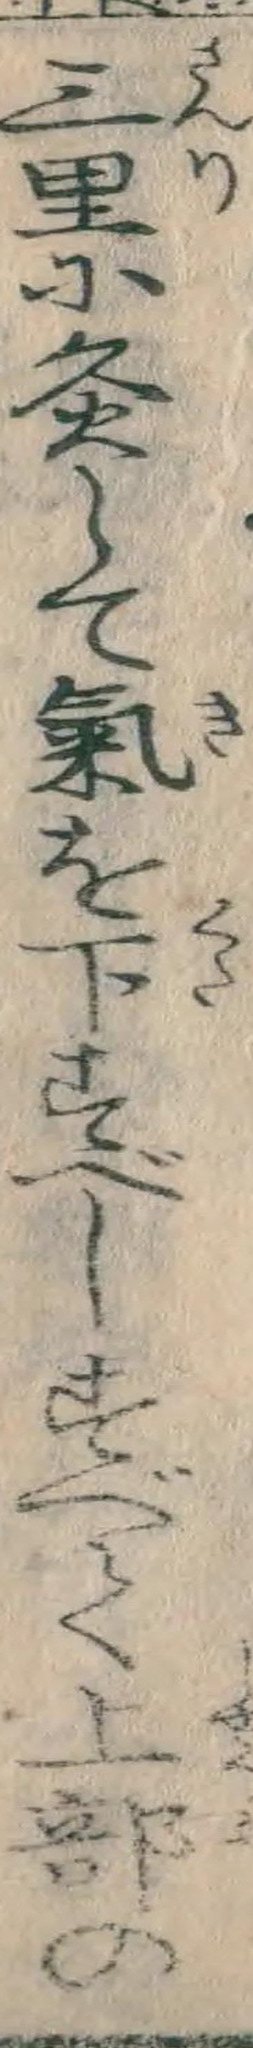三里に灸して気を下すべしすべて上部の
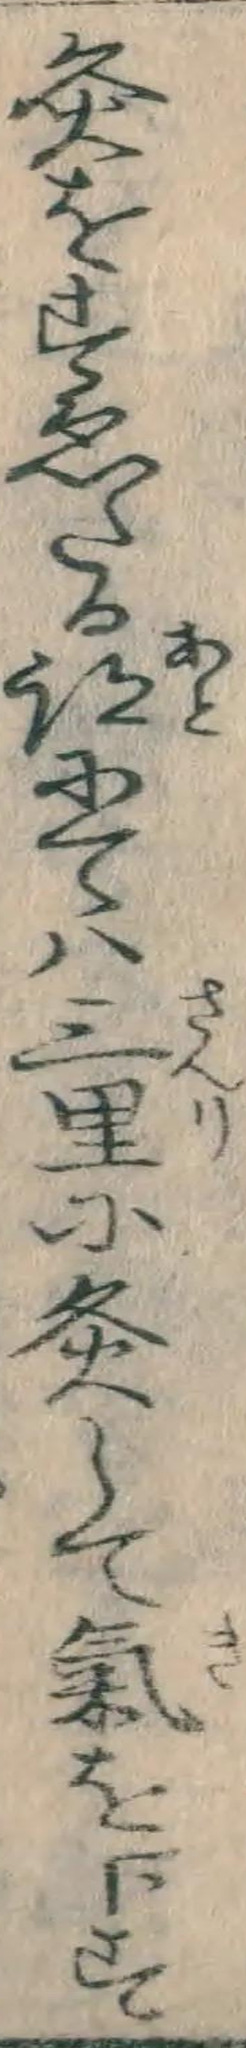灸をすゑたる後にては三里に灸して気を下す
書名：広益秘事大全 3巻. [4]
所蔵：国立国会図書館 National Diet Library, JAPAN
